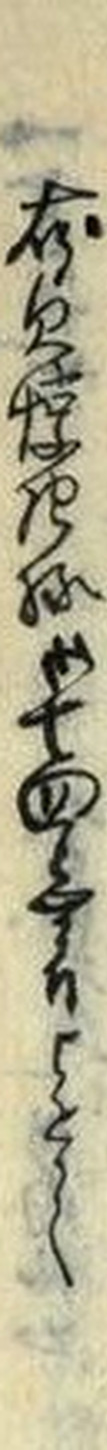右貞惇院様御七回忌ニ付被進之

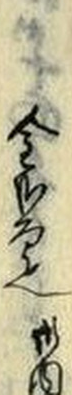金弐百疋
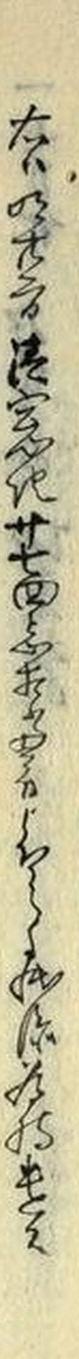右ハ明廿二日清窓院廿七回忌相当ニ付被下之手紙添為持遣ス
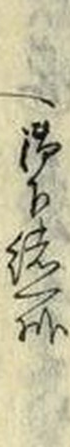御下緒一掛
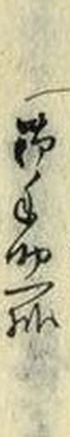御下緒一掛
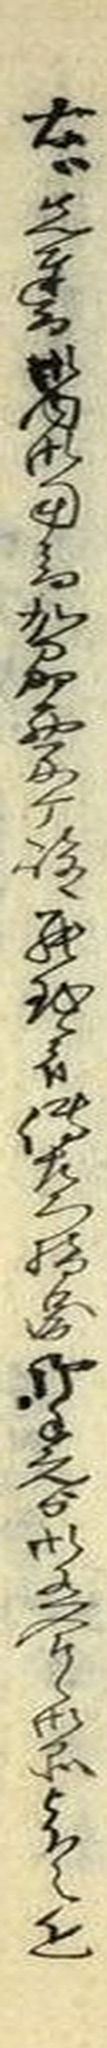右ハ先達而御内御用ニ而加州粟ケ崎へ罷越候ニ付伝左衛門指図御手元ゟ御有合之御品被下之近
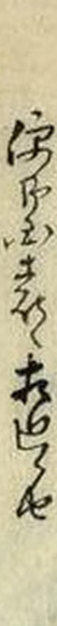便御国表へ相廻候由
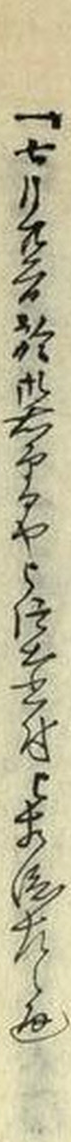一七月廿二日於御右筆部屋被仰出書付被相渡左之通
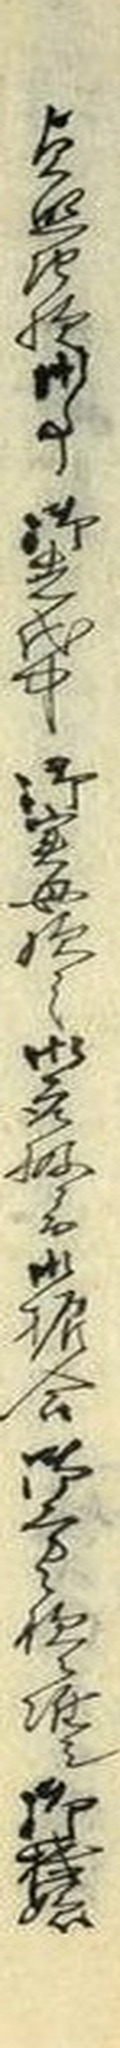貞照院様御事御先代中御実母様之御取扱ニ而御振合御方々様ニ准シ御機嫌
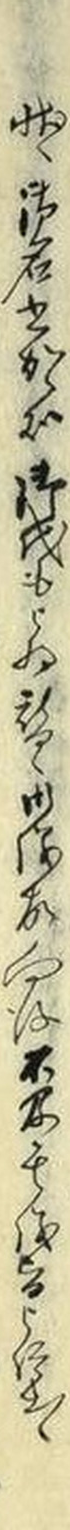状へ御名書加候処御代も被為替候御儀故向後不及其儀旨被仰出候
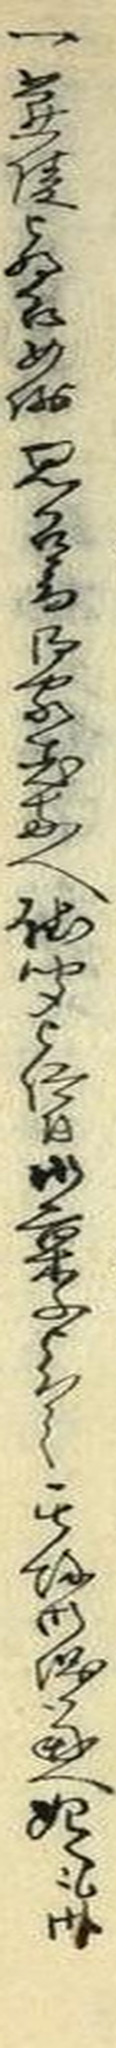一燕凌被為召如例思召ニ而御家老両人聴聞被仰付御菓子被下之其余御側御用人始へも御
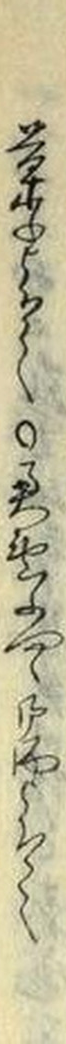菓子被下之〇奥台子向へ御酒被下之
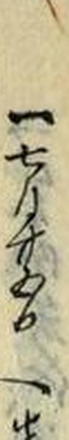一七月晦日
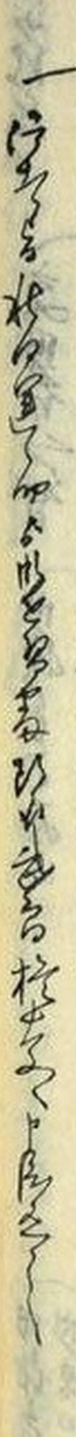仰出候旨秋田運之助ゟ御近習番頭取武曽権太夫へ申渡有之
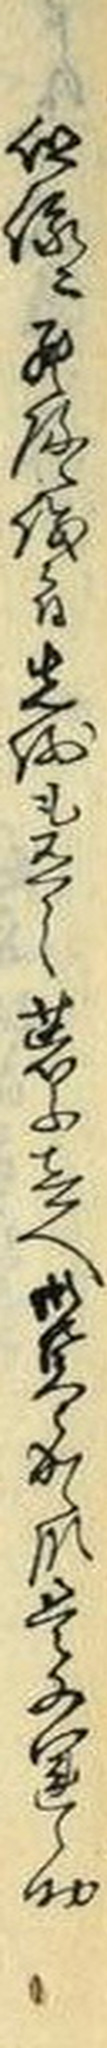但俄ニ罷帰候儀ニ付先例も有之荒子壱人御貸被成候段是又運之助申渡候
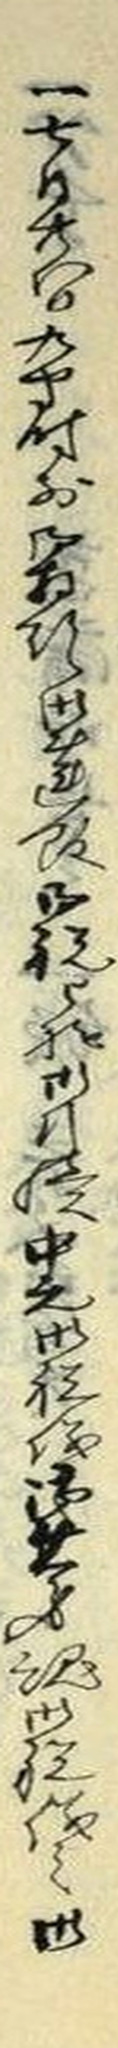一七月廿八日九半時前御拝領御蓮飯御祝被遊御引続中元御祝儀御生身魂御祝儀之御
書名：少傅日録抄（斉善付側向頭取日記、在府）
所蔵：福井県文書館 Fukui Prefectural Archives
